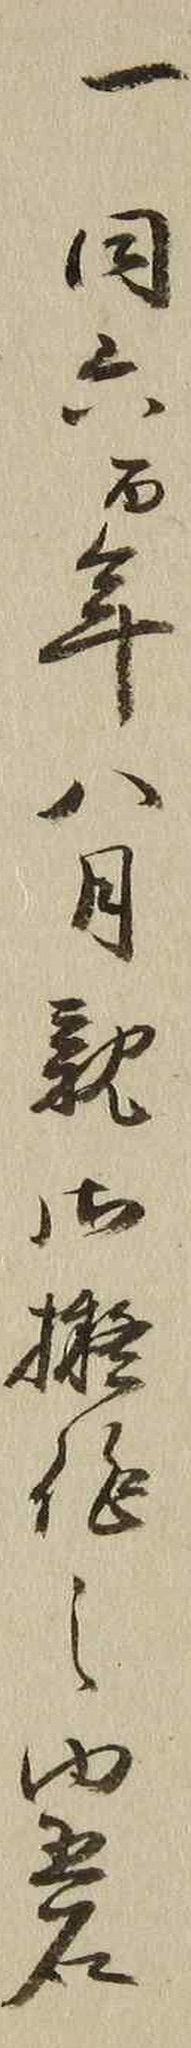一同六酉年八月親御擬作之内五石
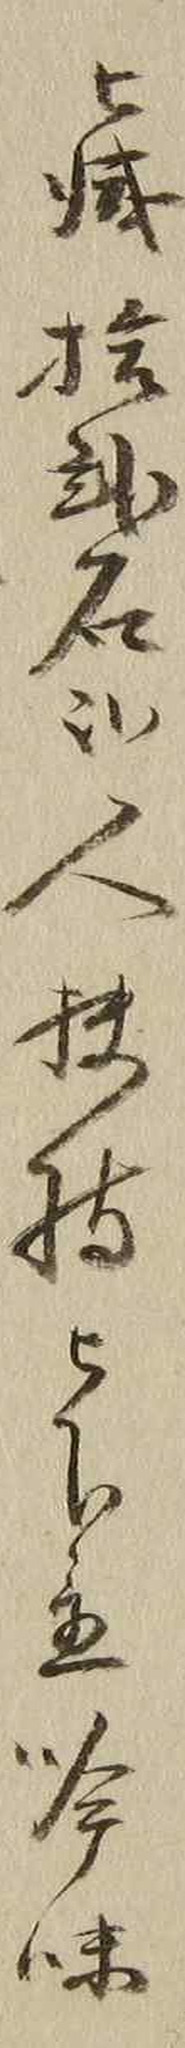被減拾弐石弐人扶持被下置吟味
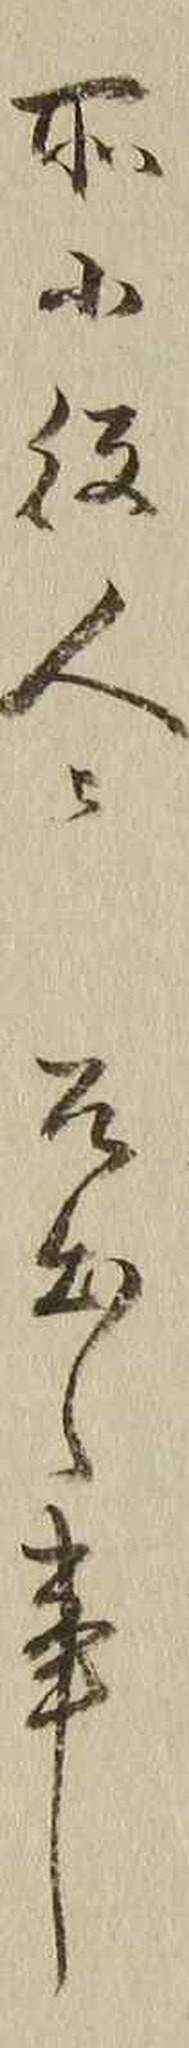所小役人被召出候事
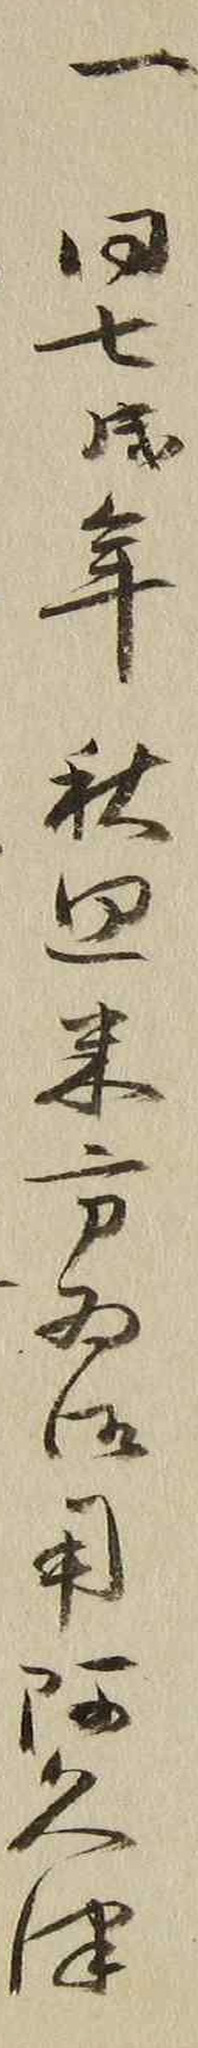一同七戌年秋廻米方為御用阿久津
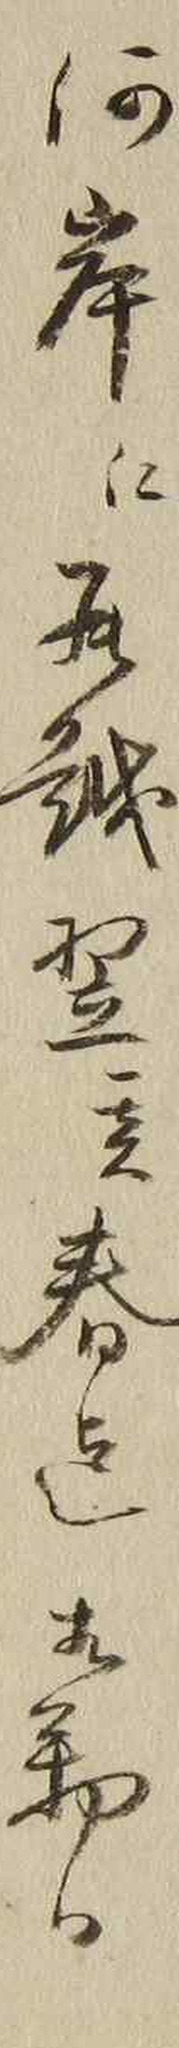河岸江罷越翌亥春迄相勤候
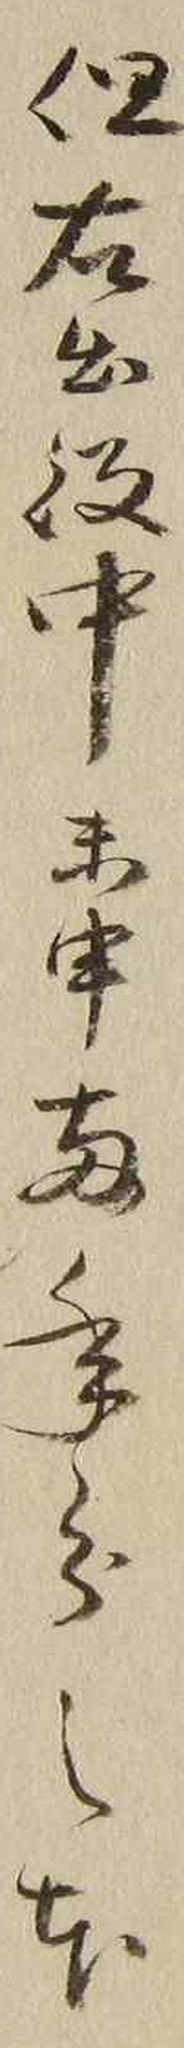但右出役中未申両年分之本
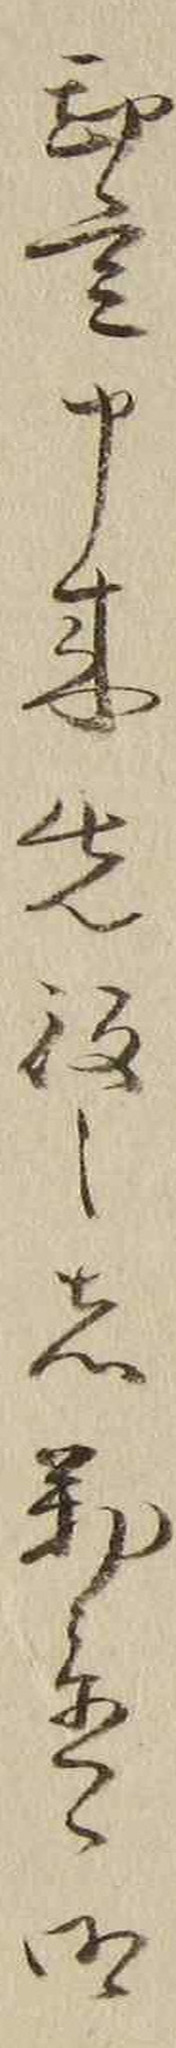勘定申来先役之者勤置候御
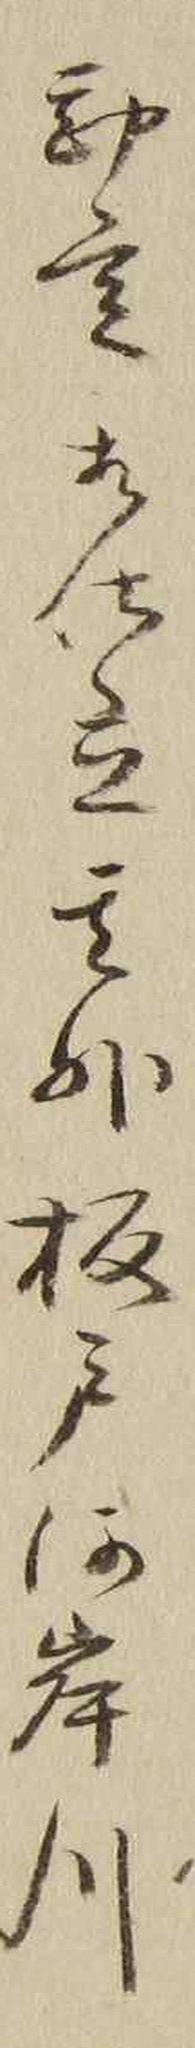勘定相仕立其外板戸河岸川
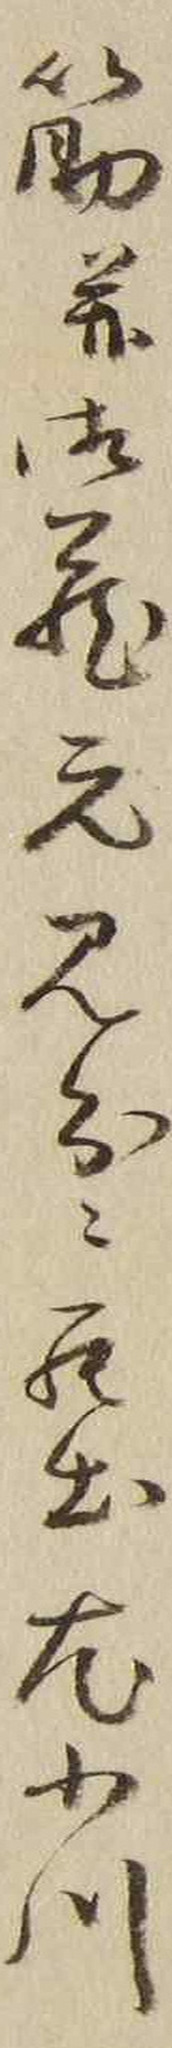筋并御蔵元見分ニ罷出尤小川

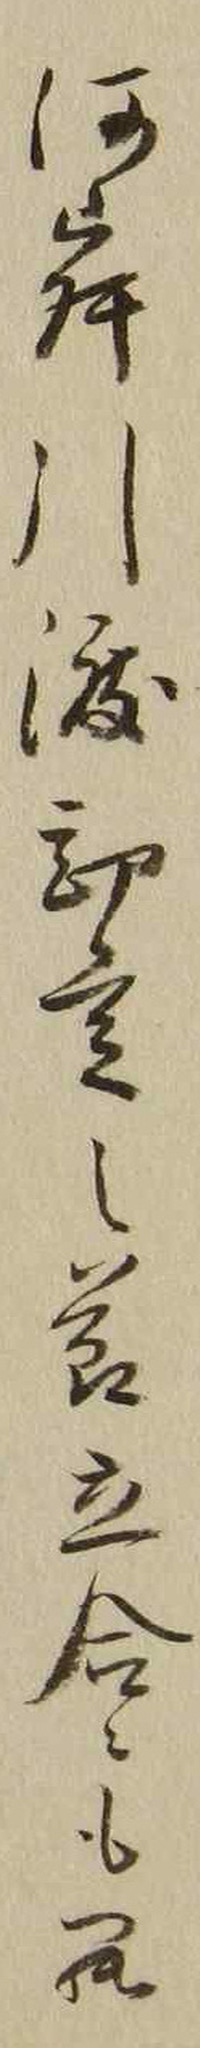河岸引渡勘定之節立合ニも罷
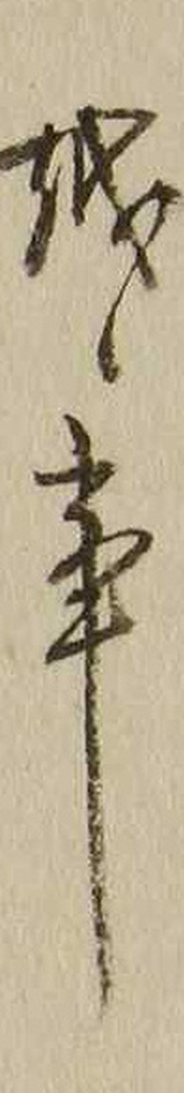越候事
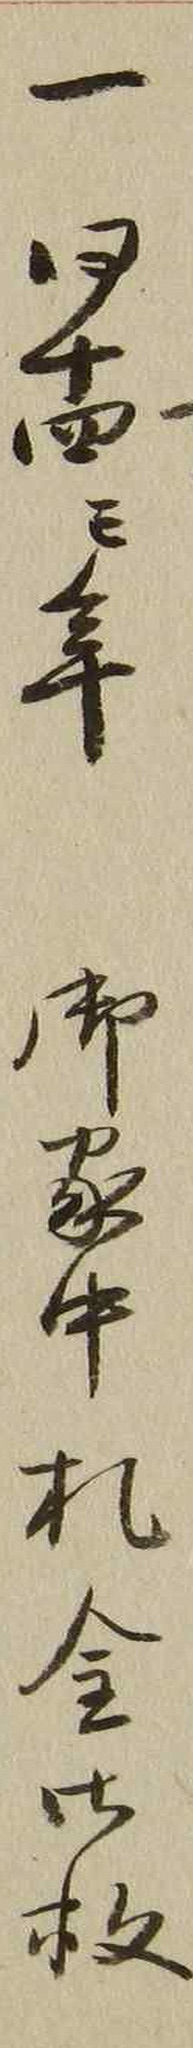一同十四巳年御家中札金御救
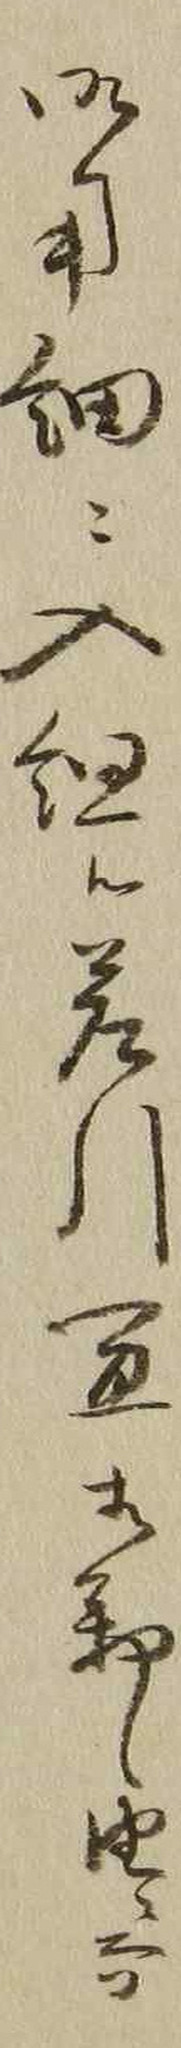御用細々入組候差引宜相勤候由ニ而
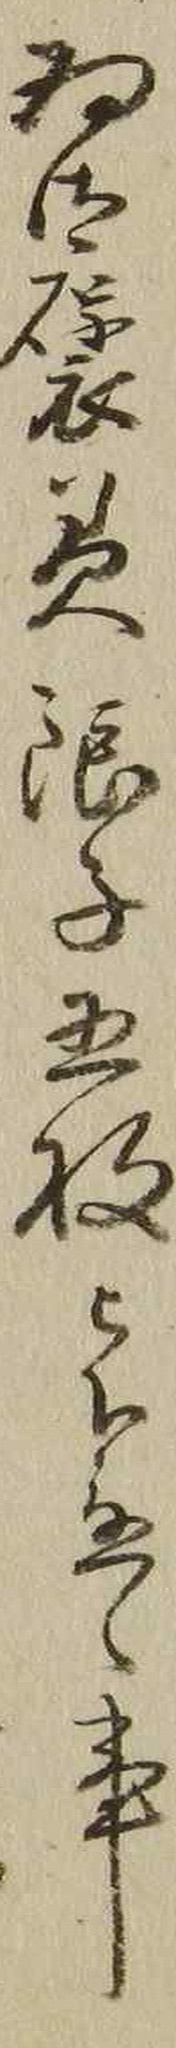為御褒美銀子五枚被下置候事
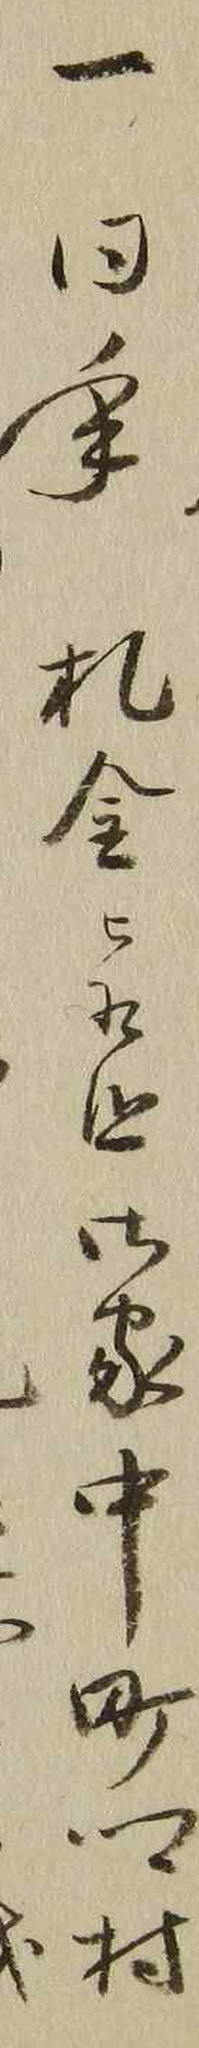一同年札金被相止御家中町郷村
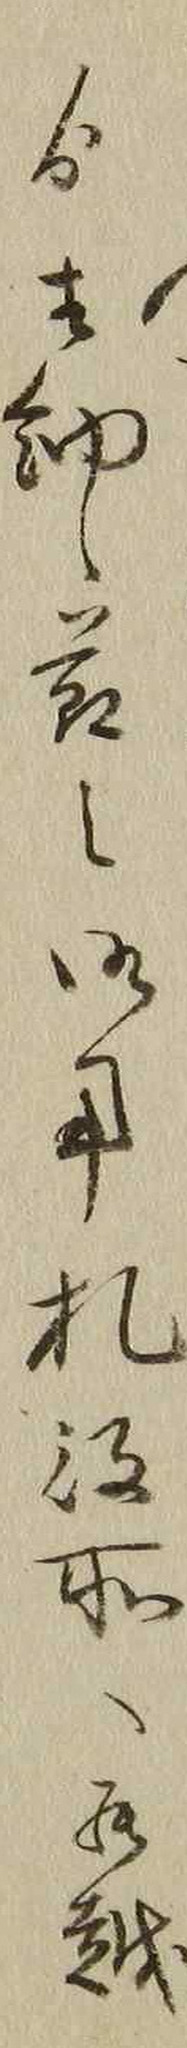ゟ相納候節之御用札役所へ罷越
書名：諸士系譜　巻之236　ふ之部4
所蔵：会津若松市立会津図書館
